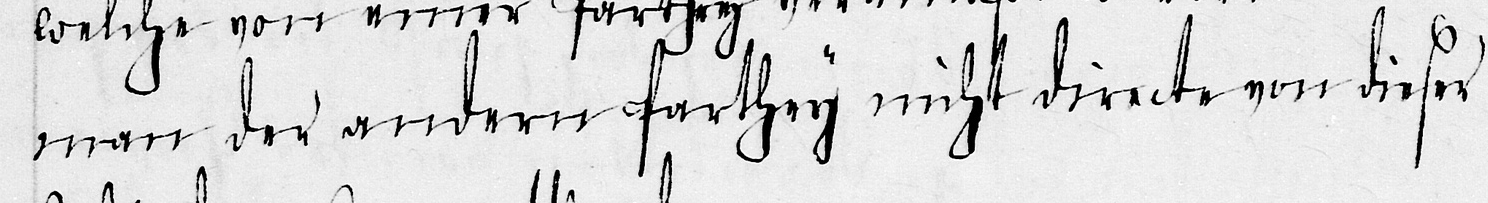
man der andern Parthey nicht directe von dieser
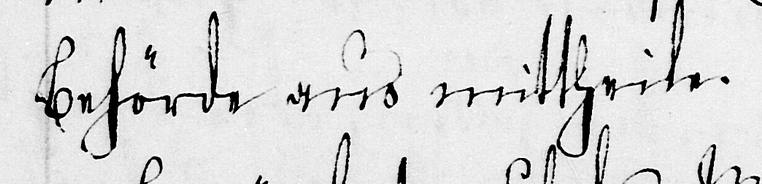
Behörde aus mittheile.
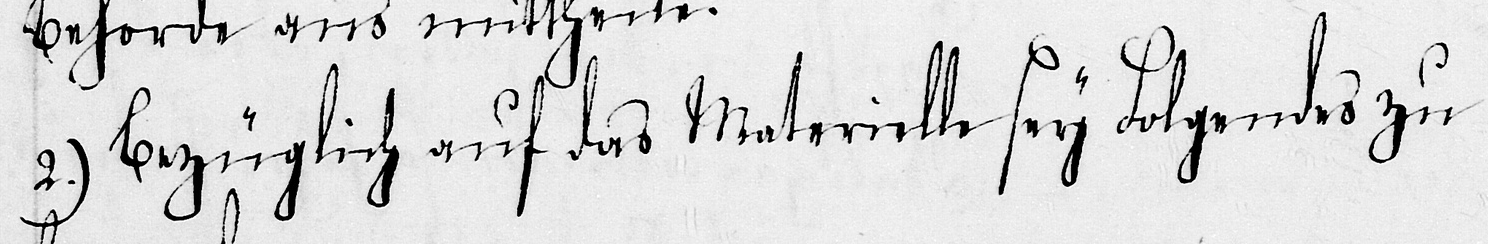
2.) Bezüglich auf das Materielle sey Folgendes zu
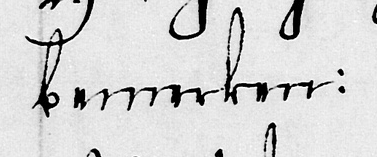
bemerken:
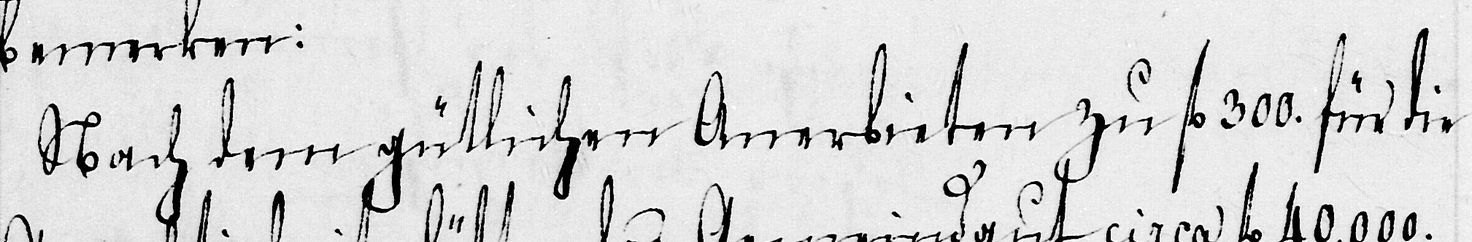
Nach dem gütlichen Anerbieten zu fl. 300. für die
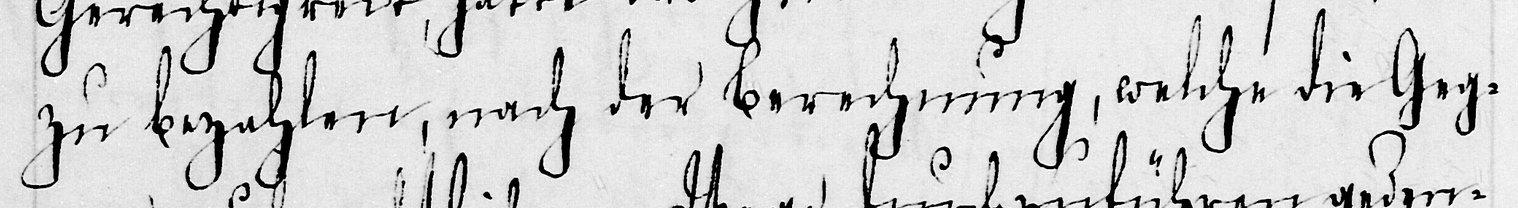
zu bezahlen, nach der Berechnung, welche die Geg¬
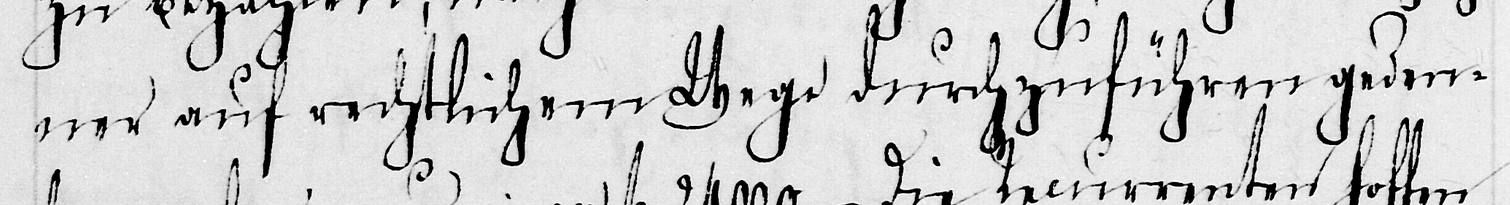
ner auf rechtlichem Wege durchzuführen geden¬
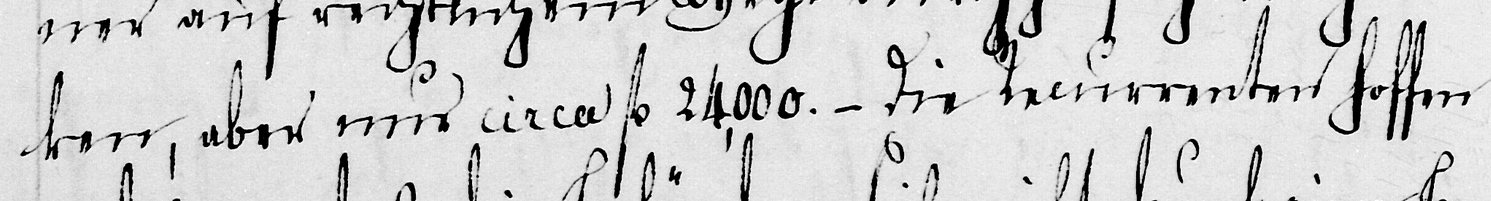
ken, aber nur circa fl. 24,000. – Die Recurrenten hoffen
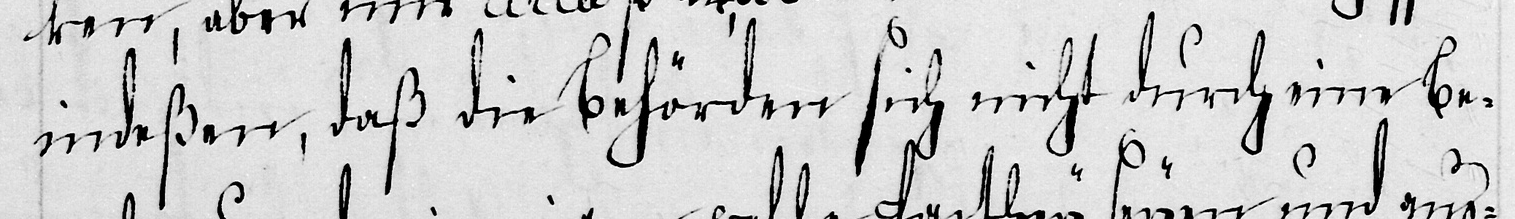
indeßen, daß die Behörden sich nicht durch eine Be¬
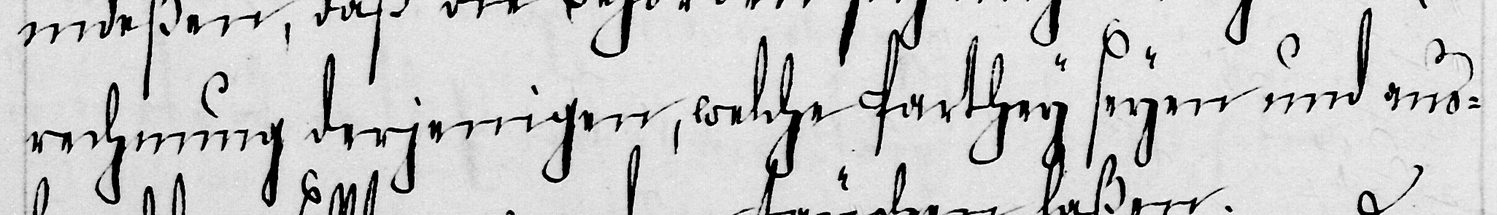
rechnung derjenigen, welche Parthey seyen und aus¬
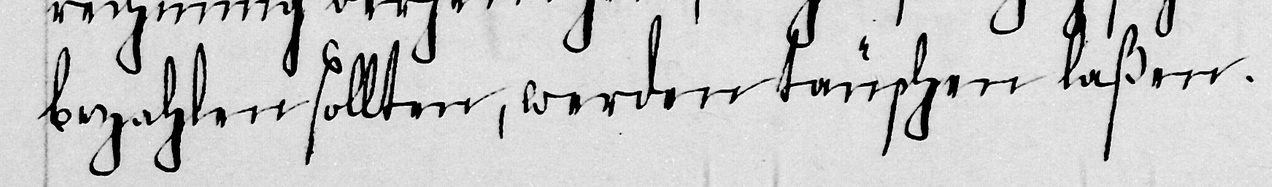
bezahlen sollten, werden täuschen laßen.
